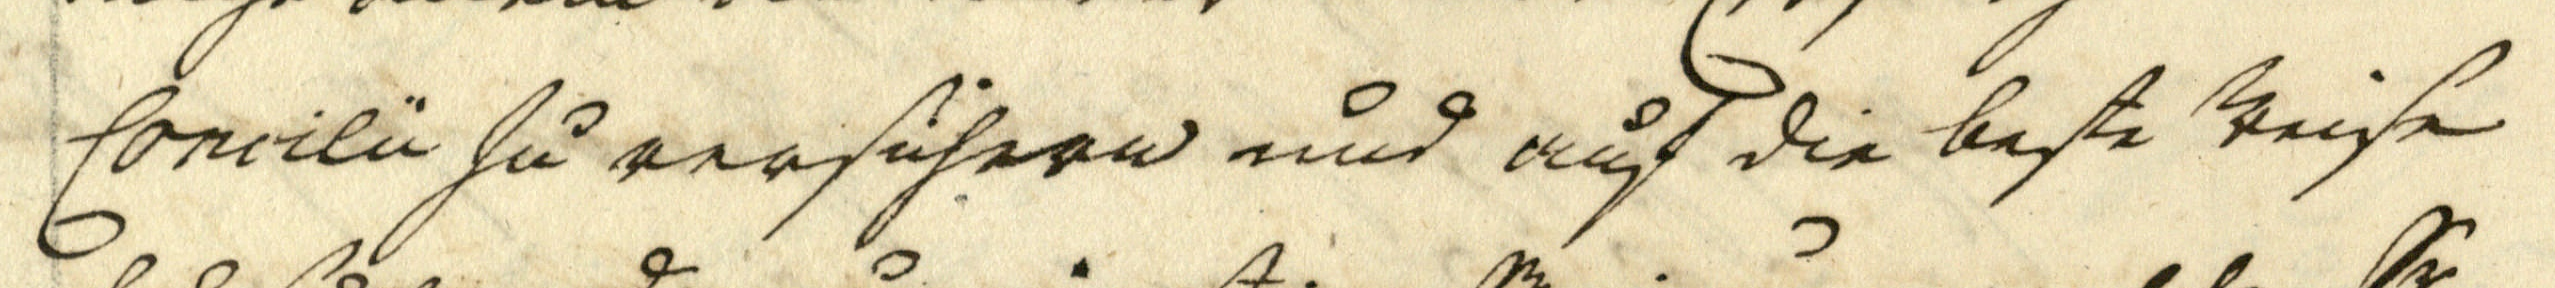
Concilii zu versichern und auf die beste Weise
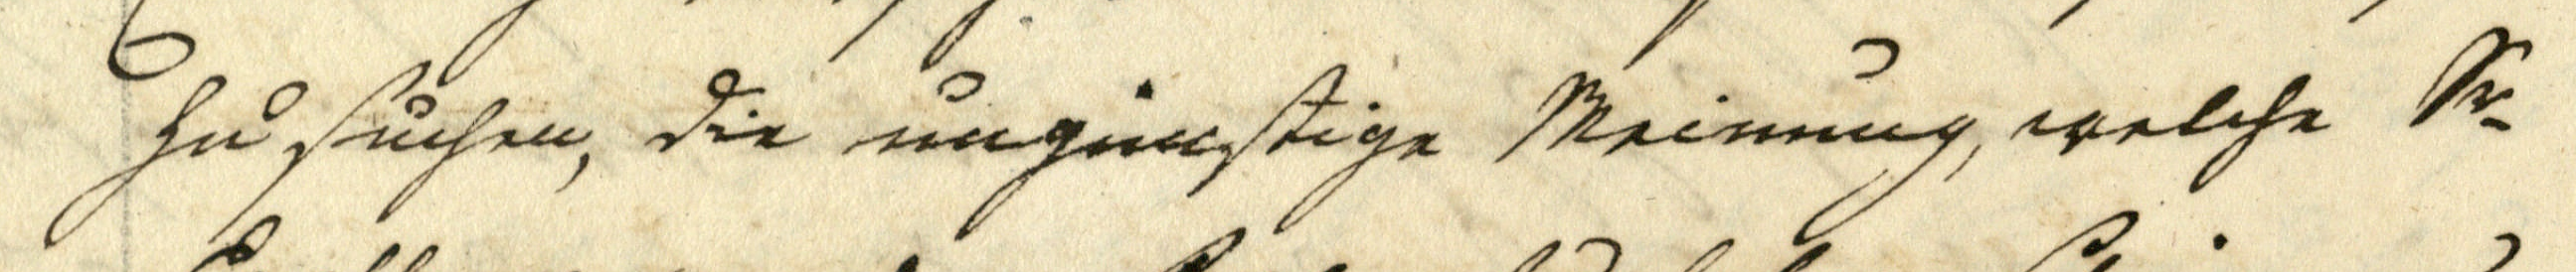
zu suchen, die ungünstige Meinung, welche Sr
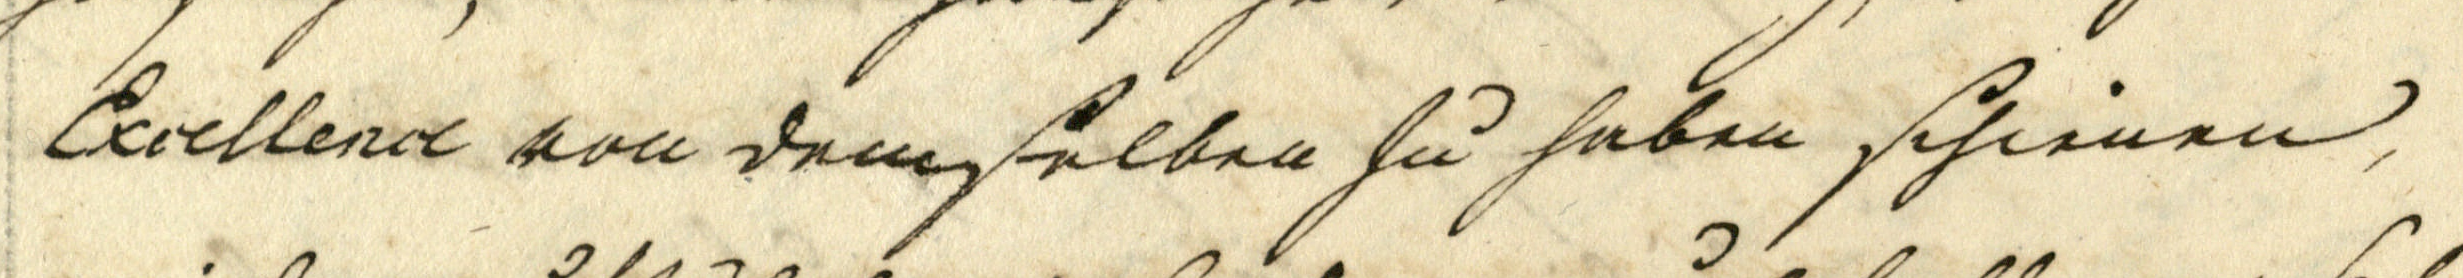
Excellence von demselben zu haben schienen
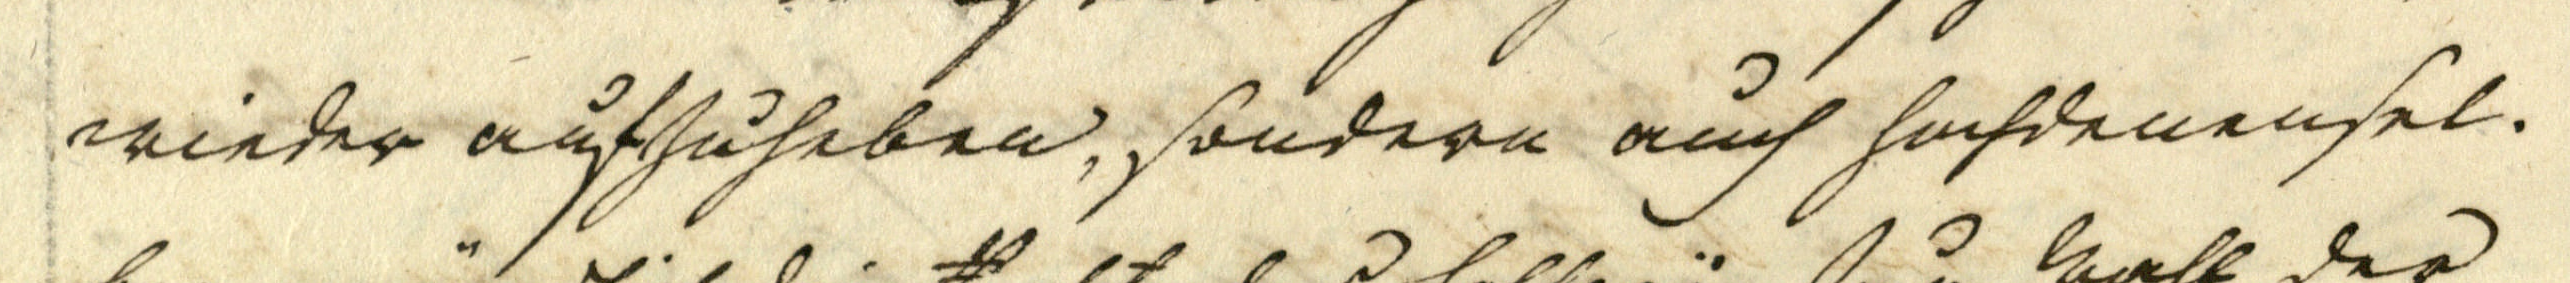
wieder aufzuheben, sondern auch hochdenensel¬
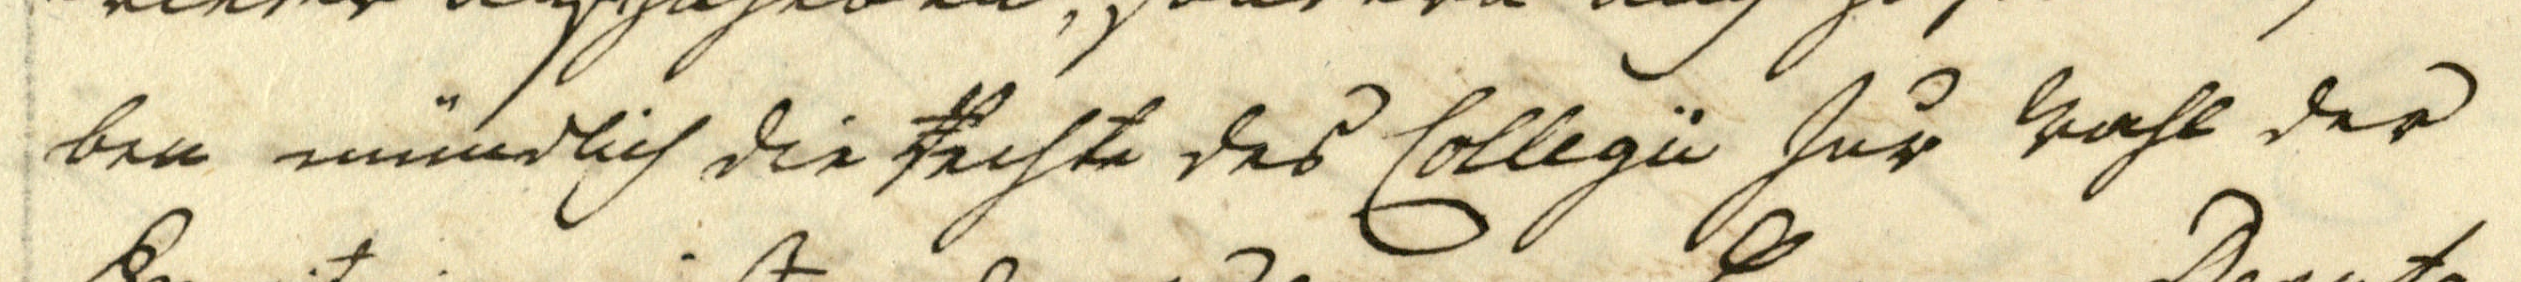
ben mündlich die Rechte des Collegii zur Wahl der
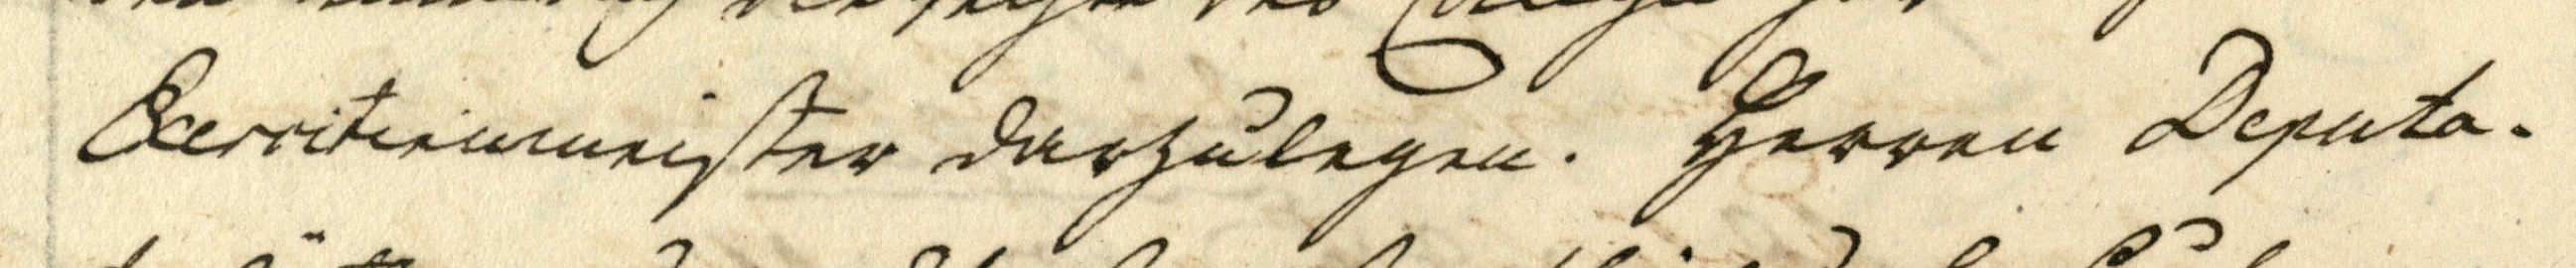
Exercitienmeister darzulegen. Herren Deputa¬
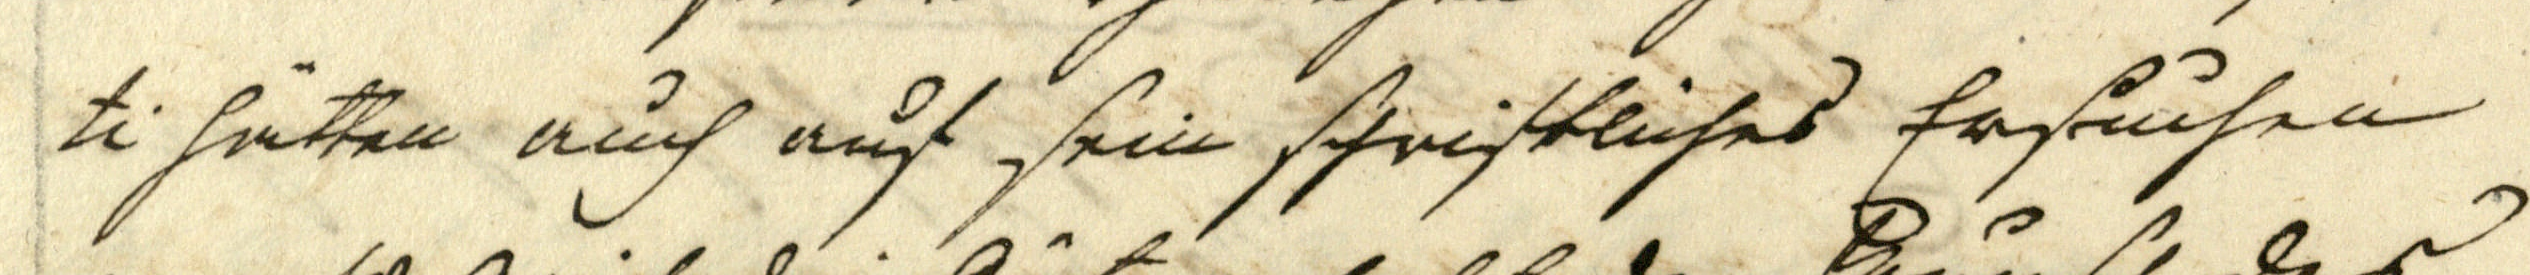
ti hätten auch auf sein schriftliches Ersuchen
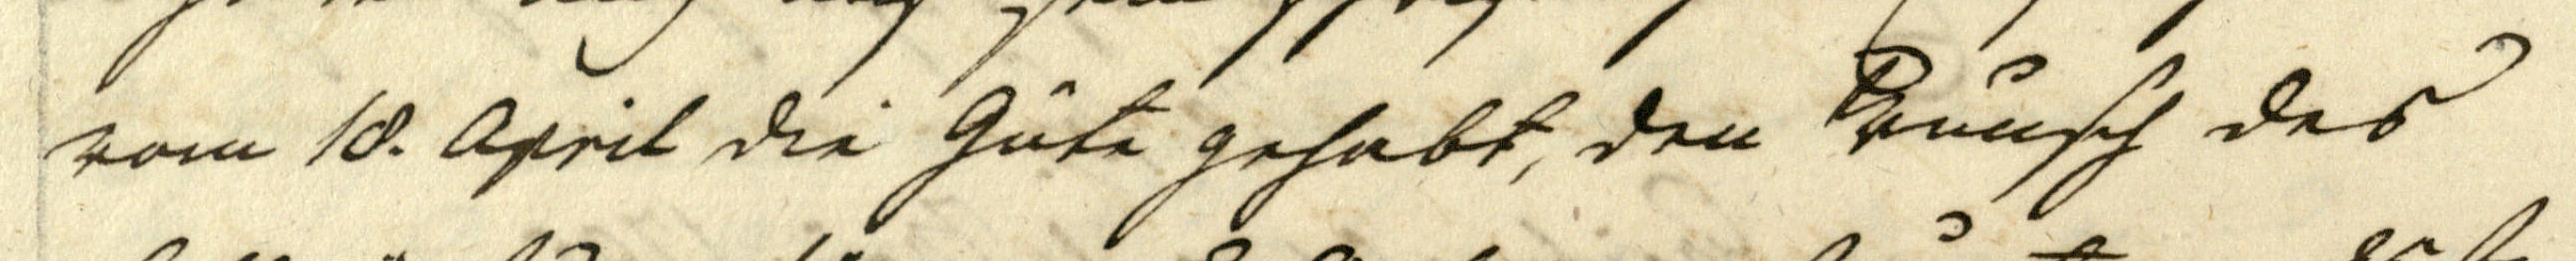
vom 18. April die Güte gehabt, den Wunsch des
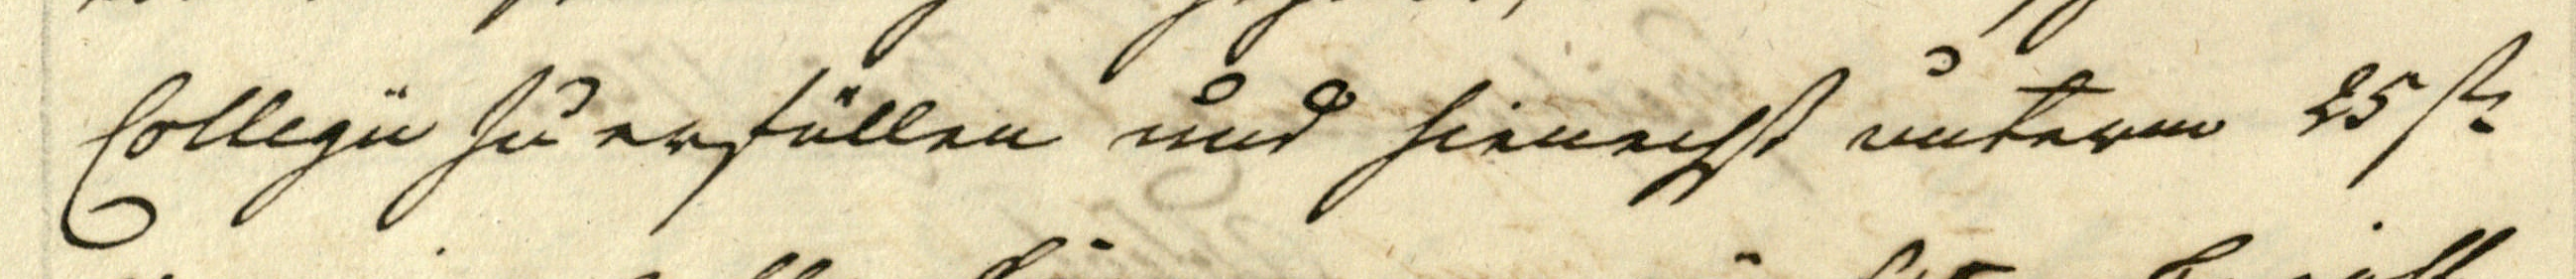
Collegii zu erfüllen und hienechst unterm 25 st.
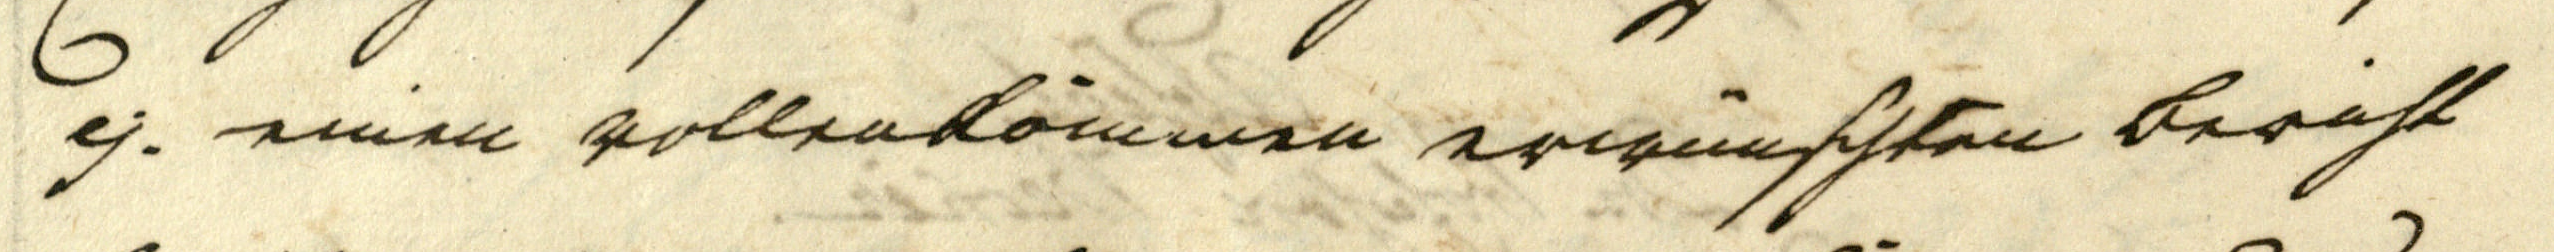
ej. einen vollenkommen erwünschten Bericht
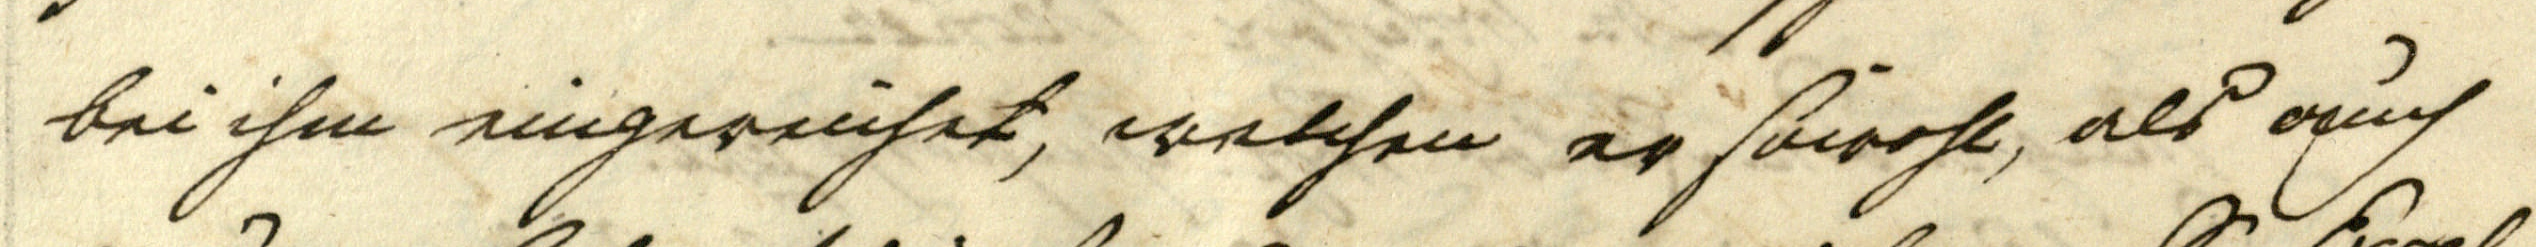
bei ihm eingereichet, welchen er sowohl, als auch
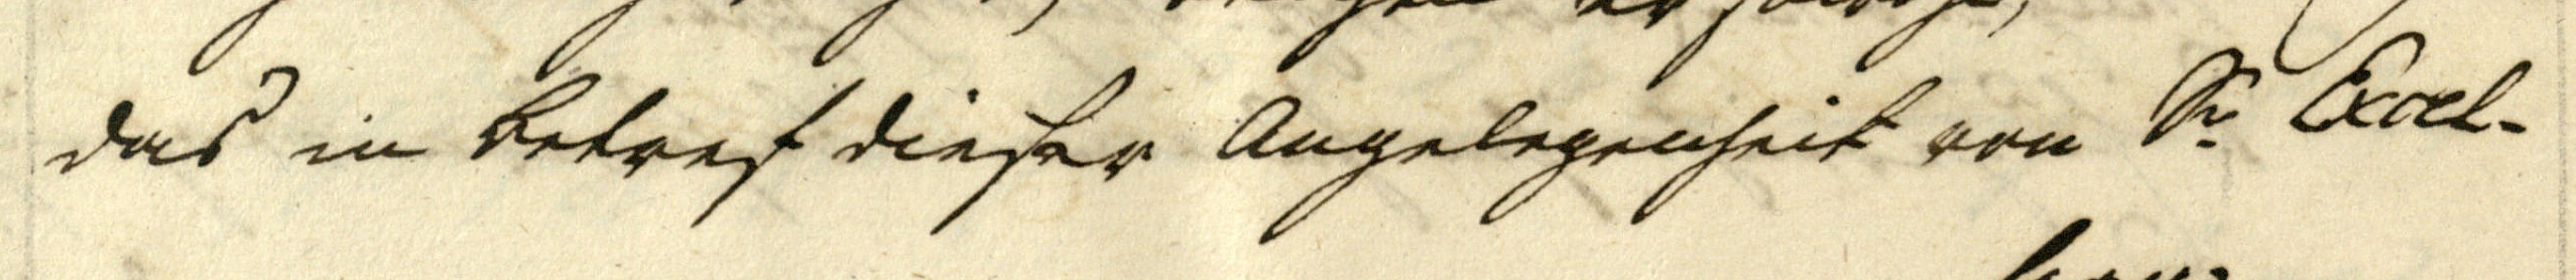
das in Betref dieser Angelegenheit von Sr. Excel¬
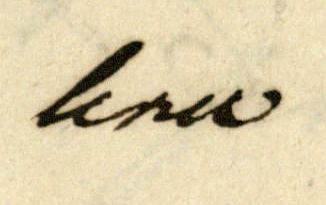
lence
